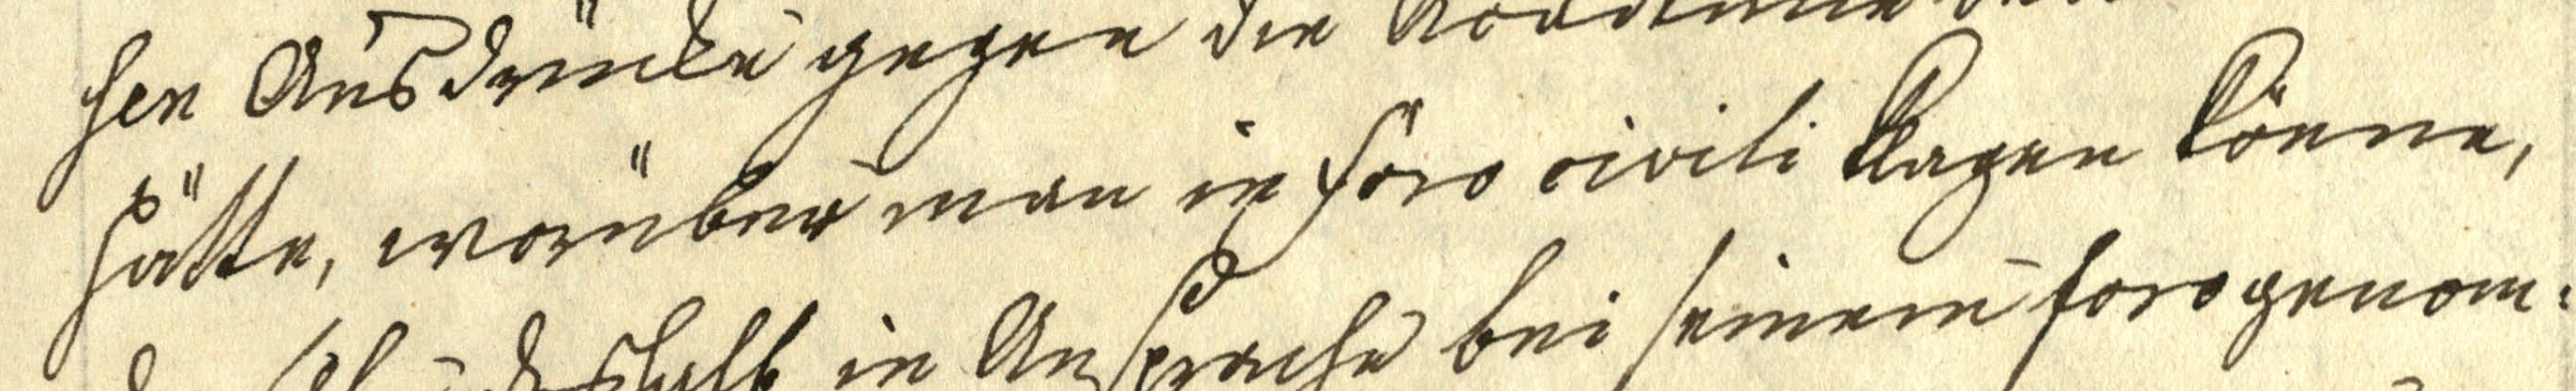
hätte, worüber man in foro civiti klagen könne,
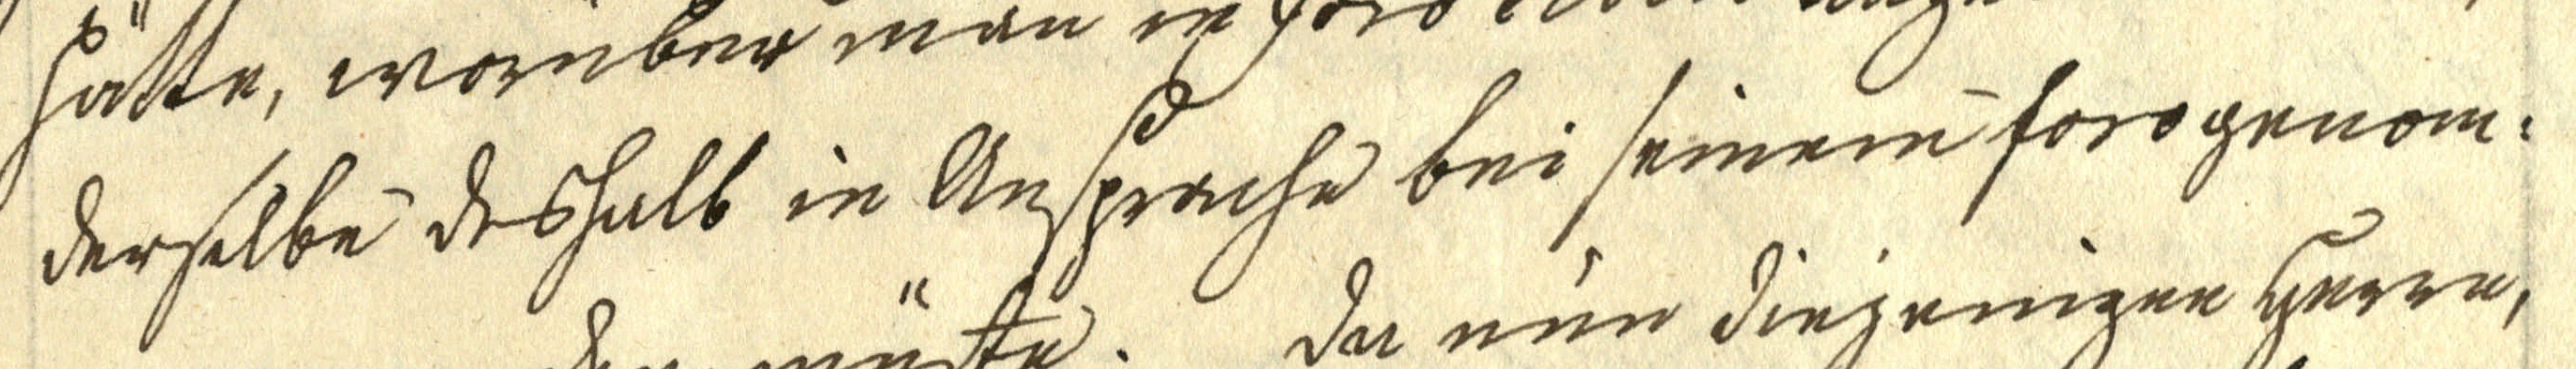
derselbe deshalb in Ansprache bei seinem foro genom¬
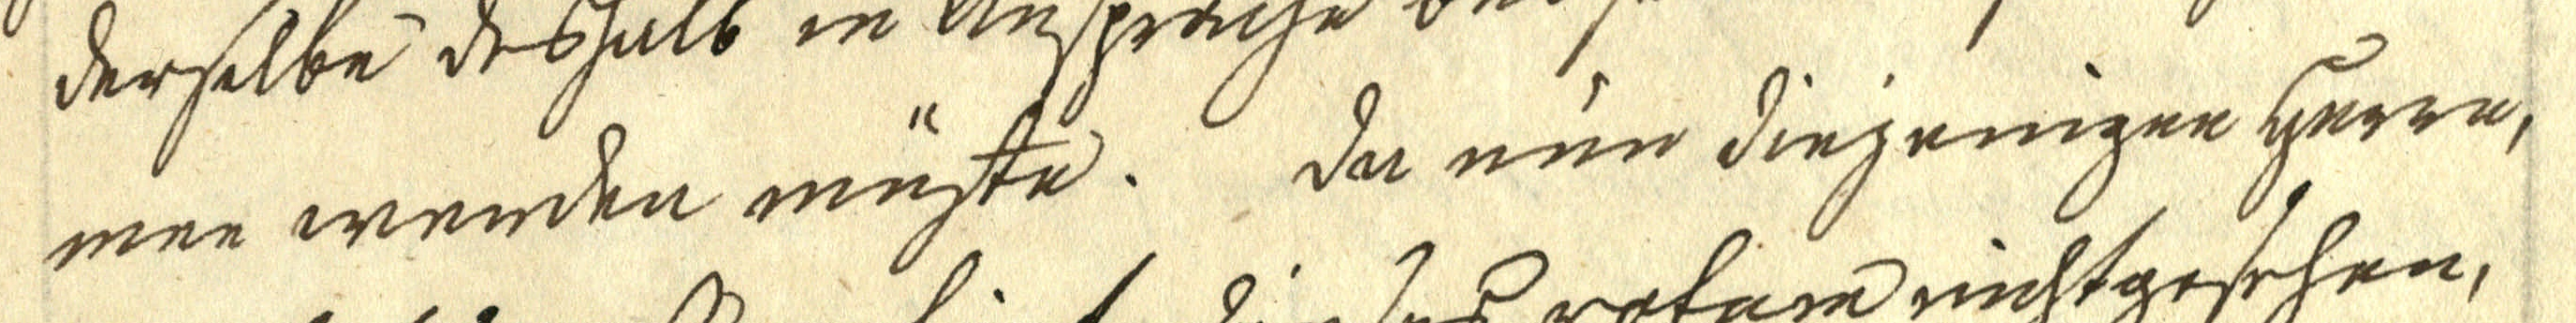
men werden müste. Da nun diejenigen Herrn,
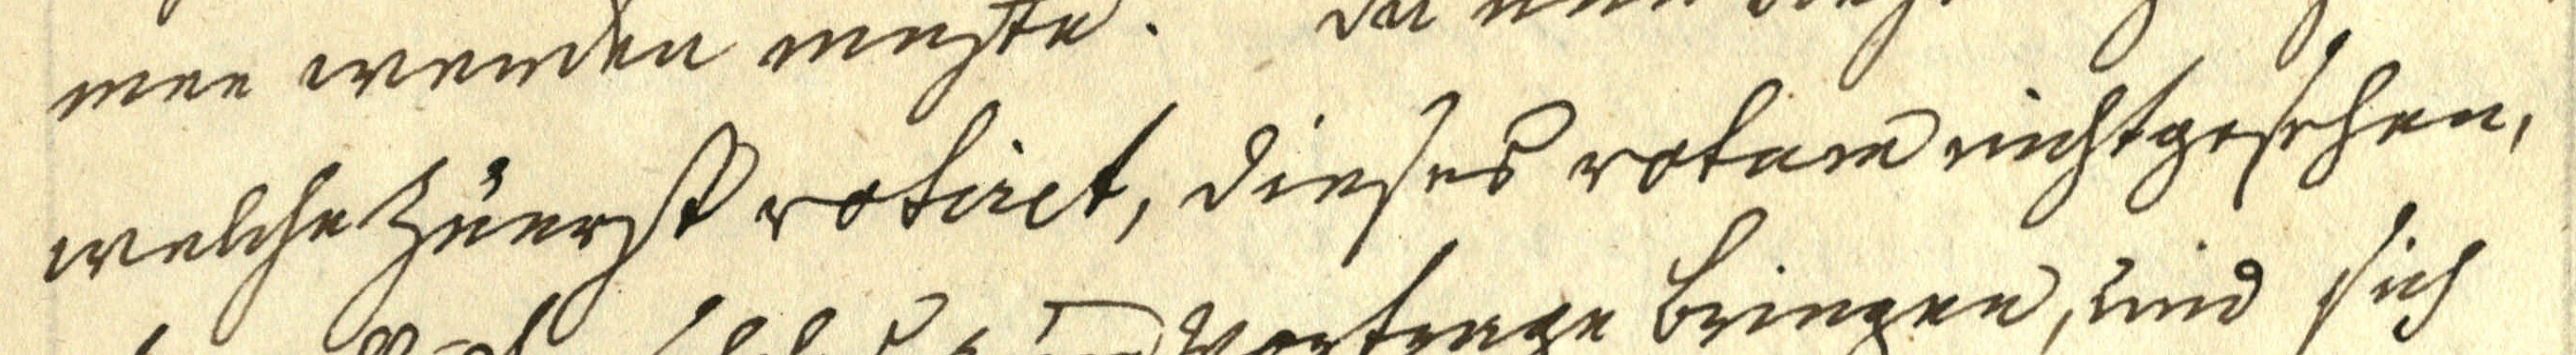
welche zuerst votiret, dieses votum nichtgesehen,
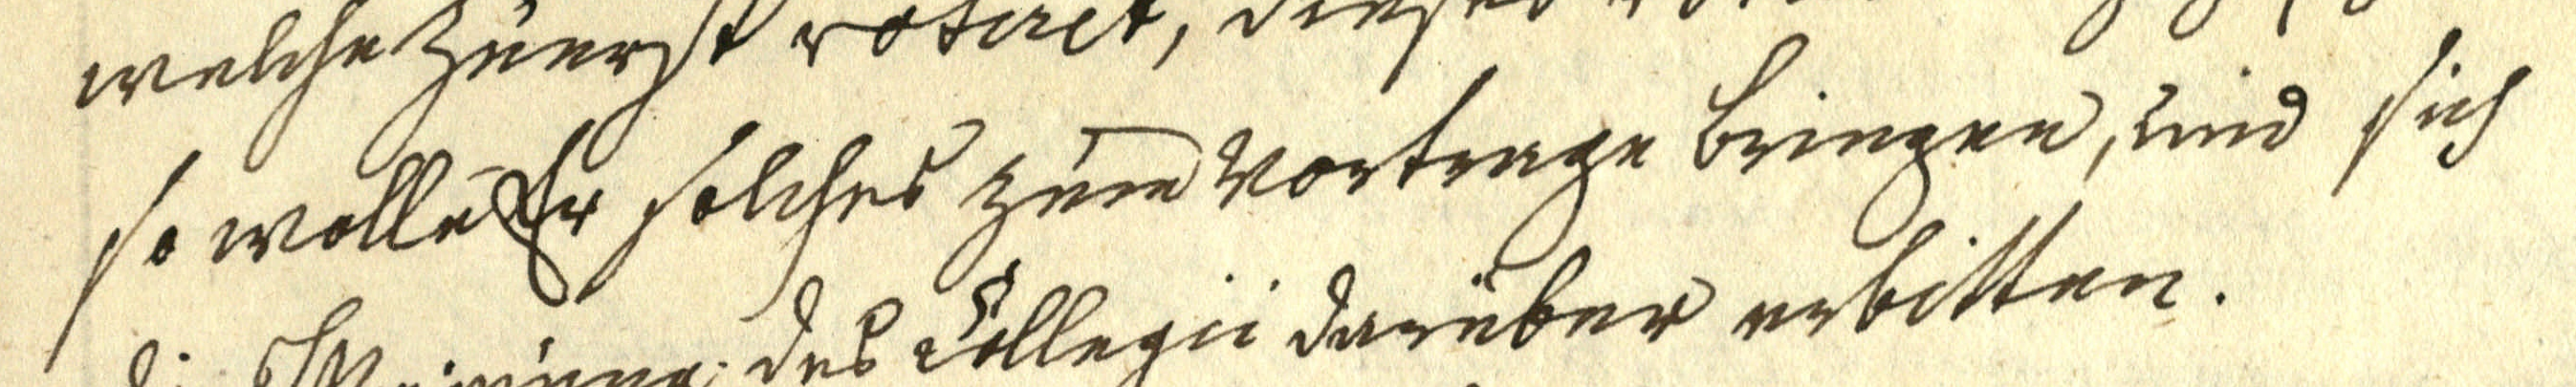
so wolle Er solches zum Vortrage bringen, und sich
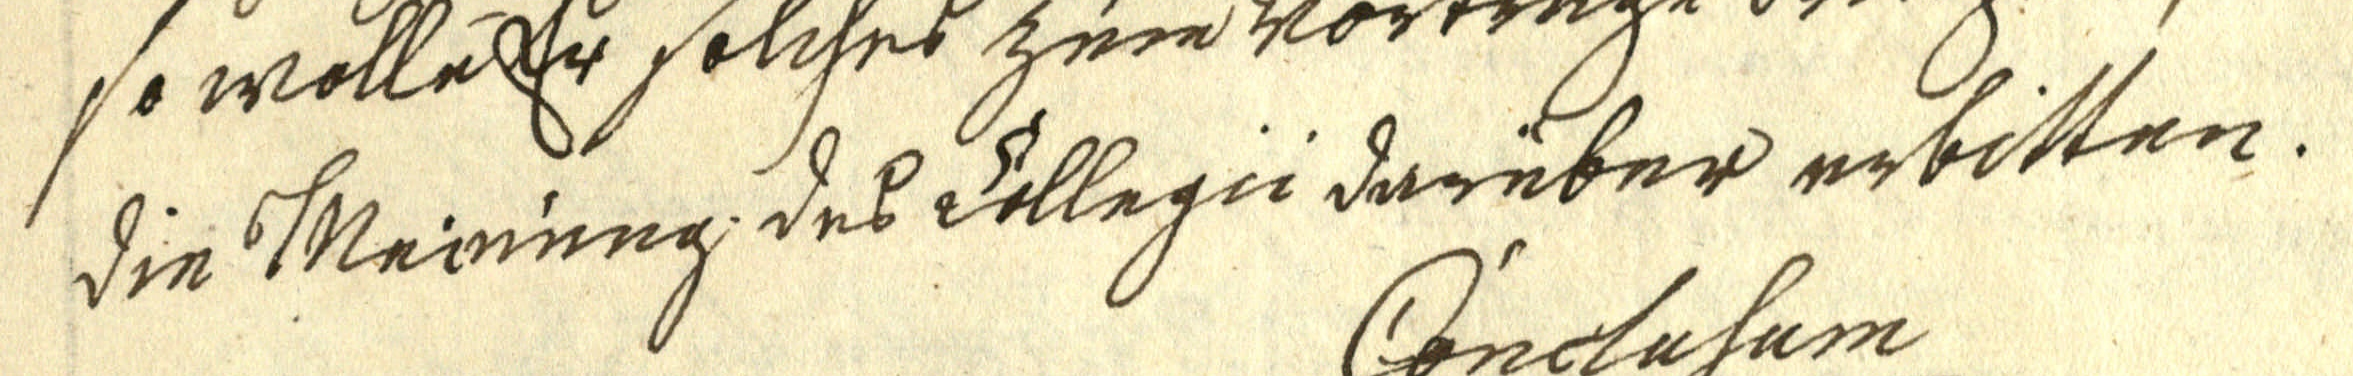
die Meinung des Collegii darüber erbitten.
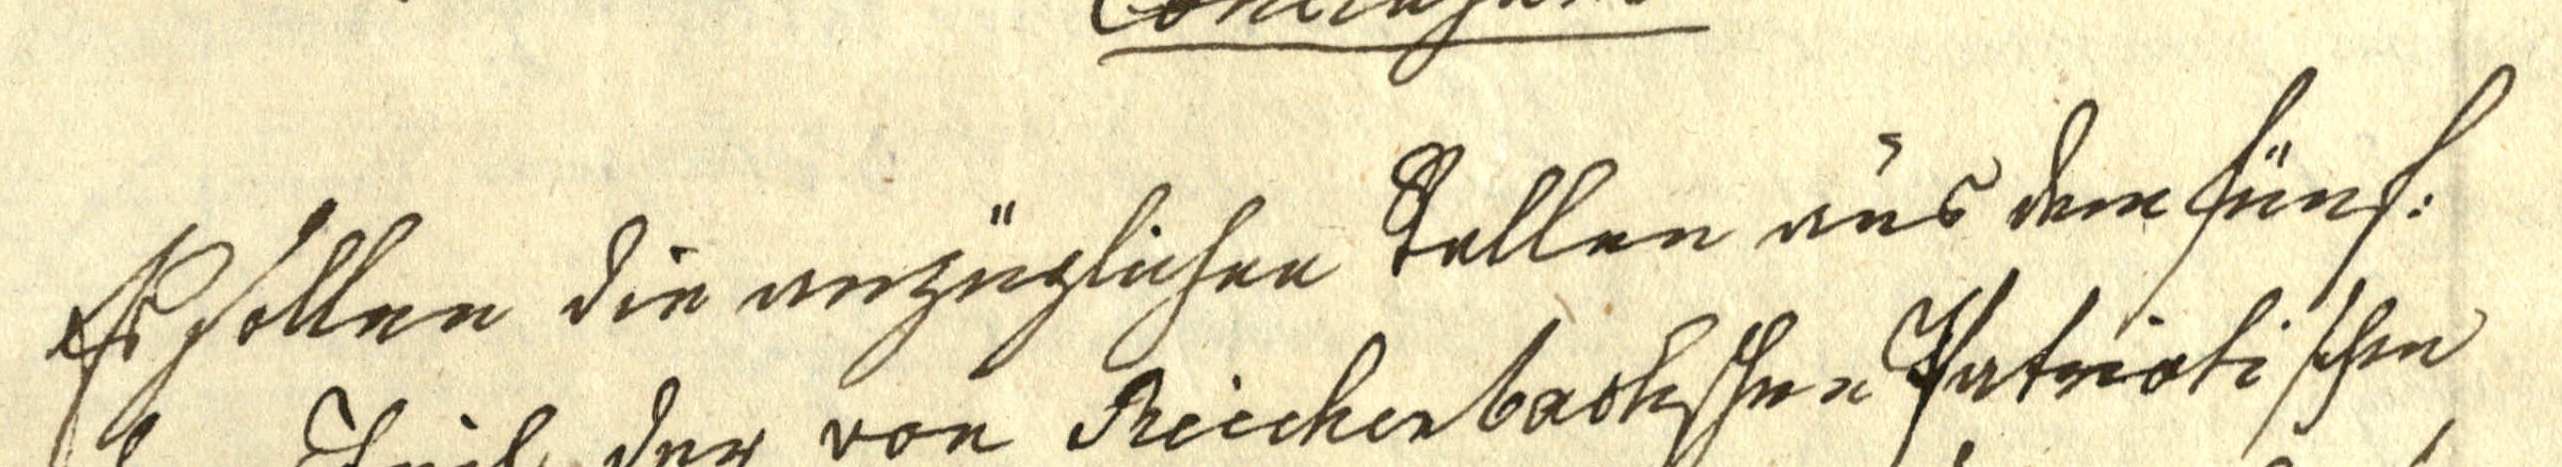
Er sollen die anzüglichen Stellen aus dem fünf¬
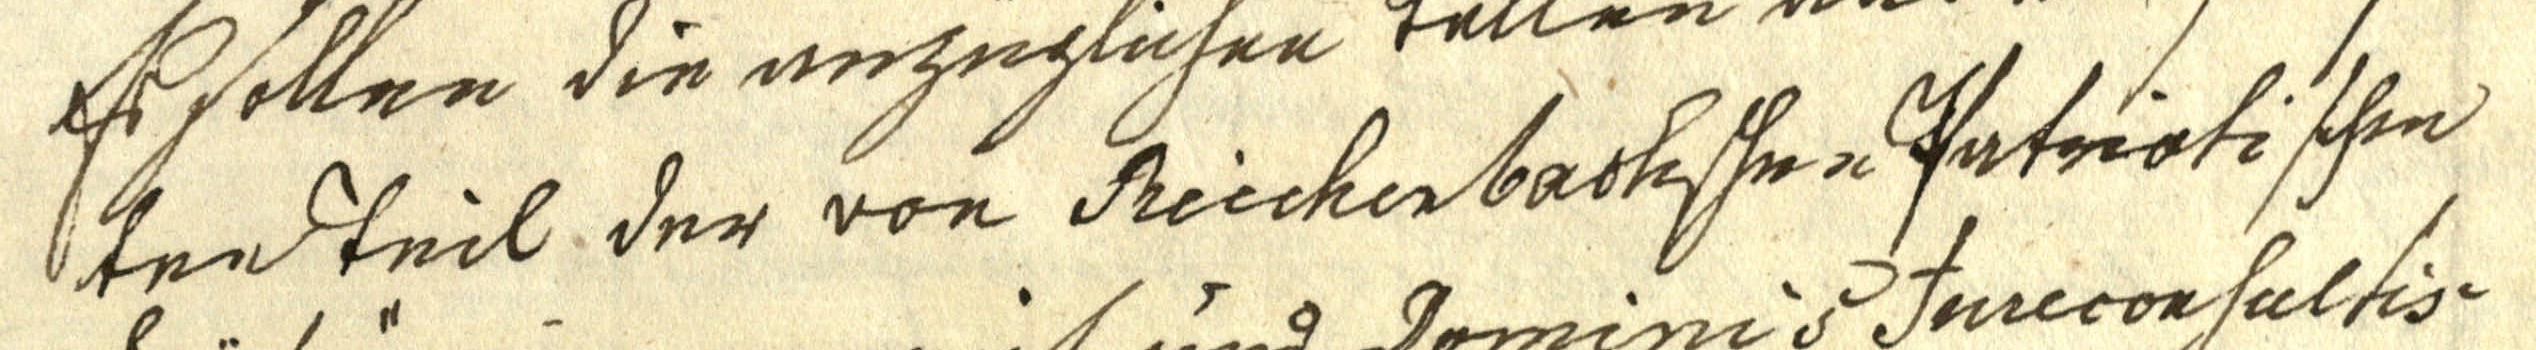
ten Teil der von Reichenbachschen Patriotischen
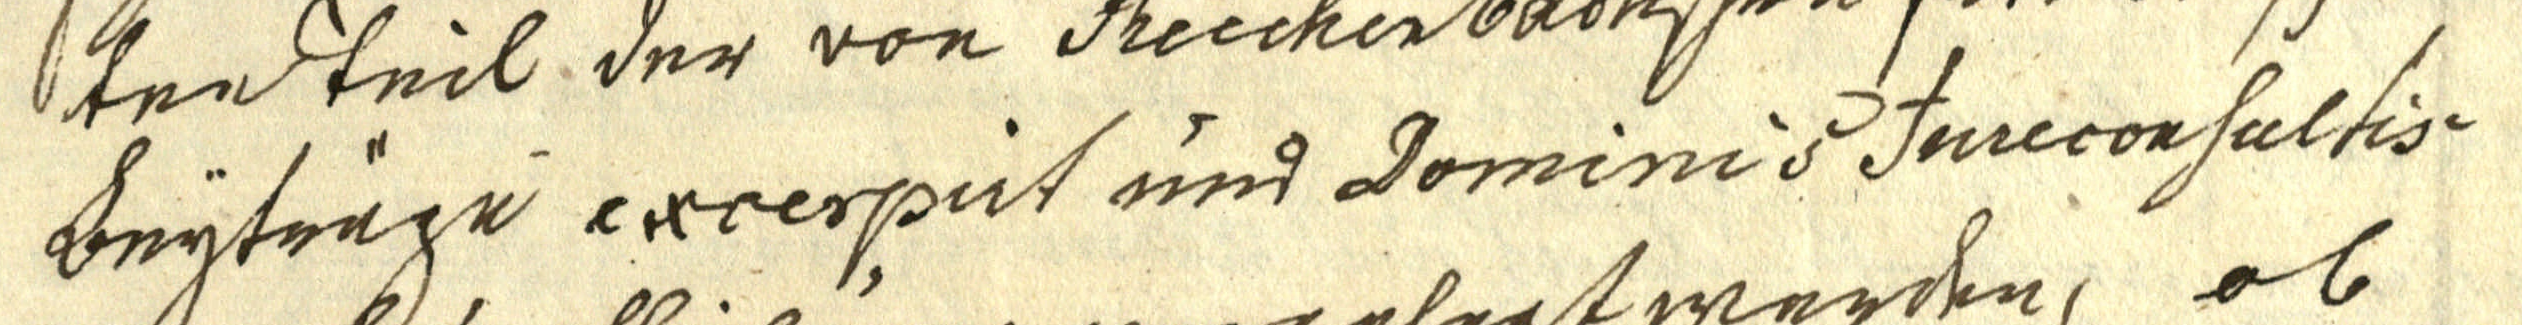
Beÿträge excerpirt und Dominis Jureconsultis
